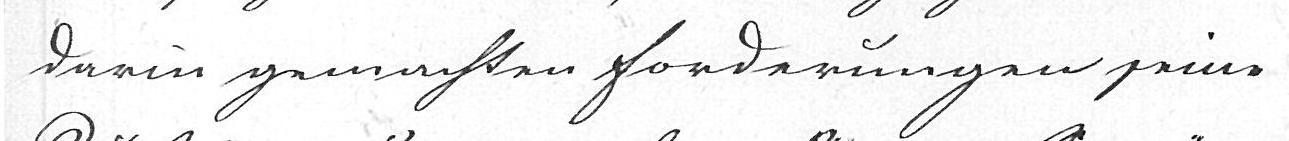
darin gemachten Forderungen seine
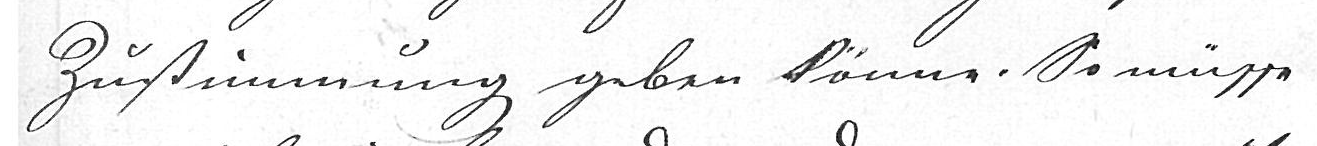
Zustimmung geben könne. So müsse
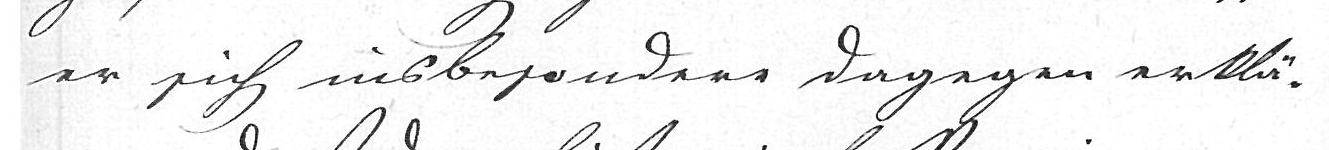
er sich insbesondere dagegen erklär-
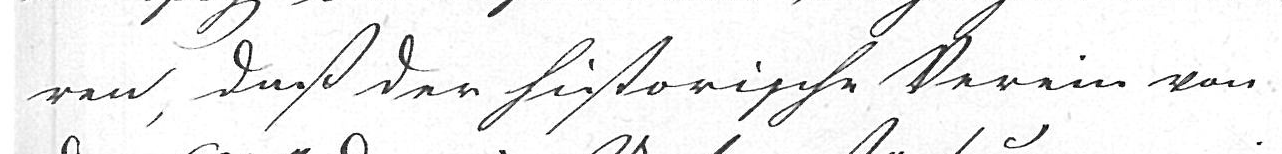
ren daß der historische Verein von
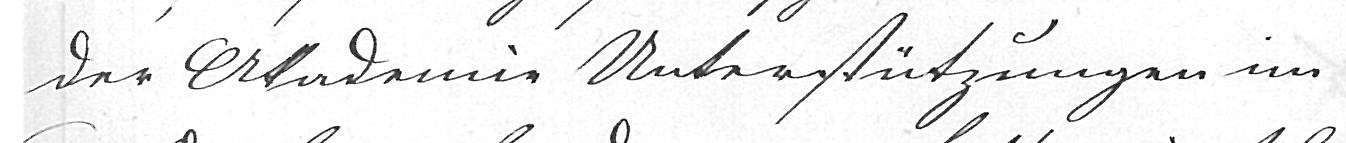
der Akademie Unterstützungen im
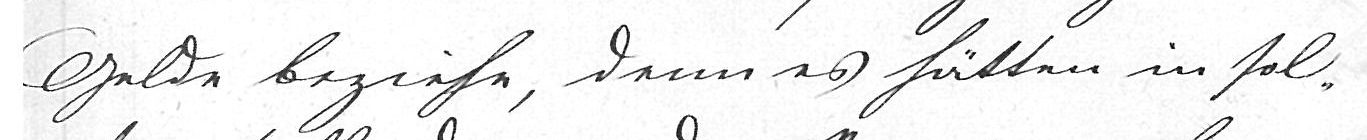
Gelde beziehe, denn es hätten in sol-
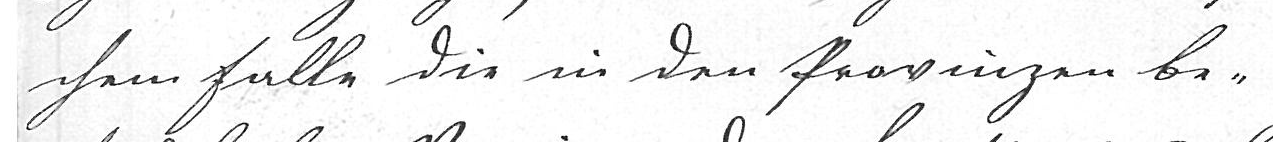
chem Falle die in den Provinzen be-
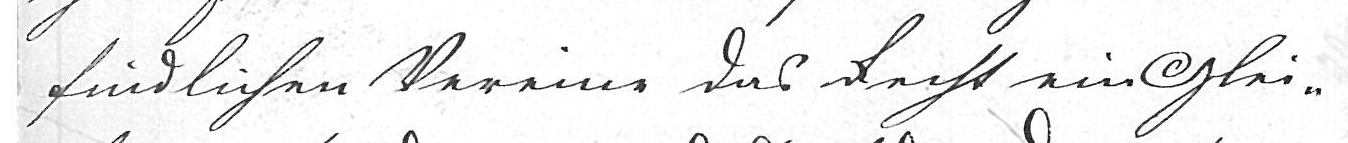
findlichen Vereine das Recht ein Glei-
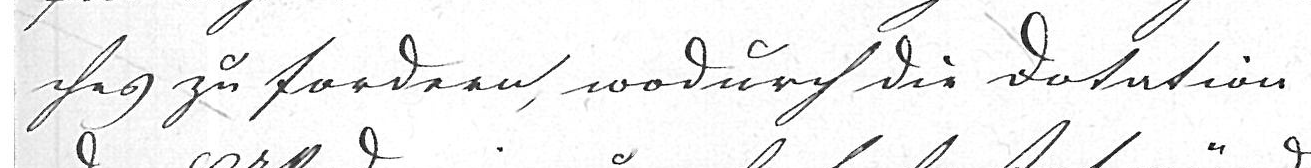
ches zu fordern, wodurch die Dotation
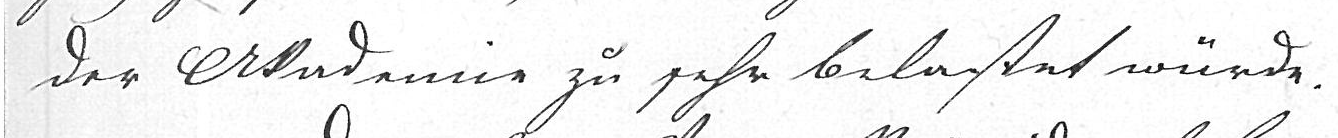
der Akademie zu sehr belastet würde.
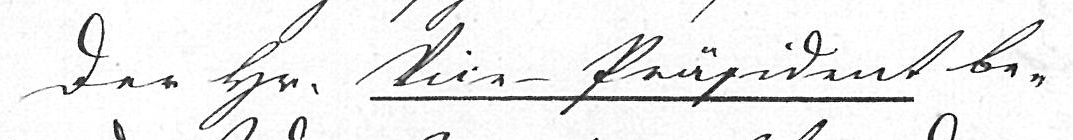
Der Hr. Vice-Präsident be-
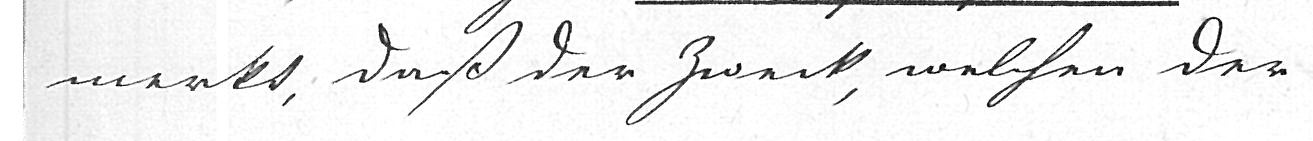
merkt, daß der Zweck, welchen der
